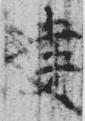○（隨）
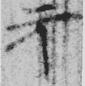元
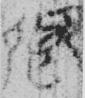卿（亨）
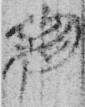利
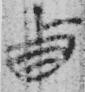貞
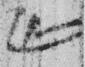亡（无）
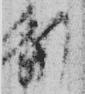咎
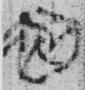初
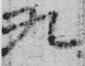九
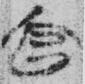官
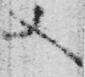又（有）
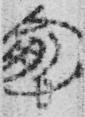愈（渝）
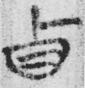貞
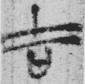吉
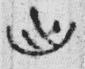出
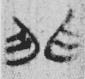門
